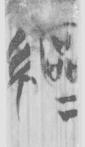{糸區}=
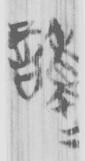諥=
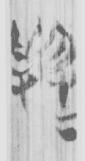與=
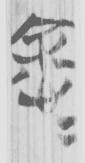悆=
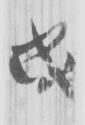奴
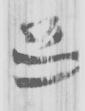隧
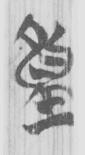重
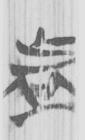者
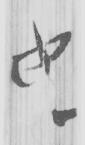女
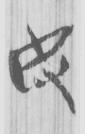奴
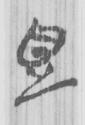見
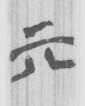亓
